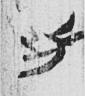此
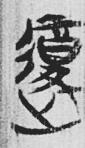復
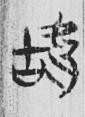{古欠}（苦）
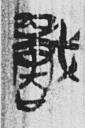戰
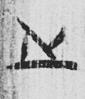之
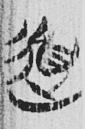道
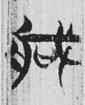藏（莊）
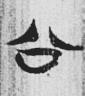公
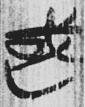或
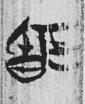䎽（聞）
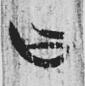曰
